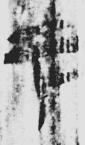下
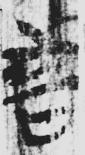者
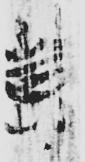莫
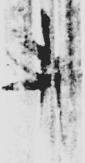之
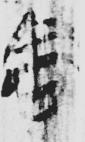舍（予）
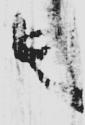也
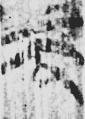而
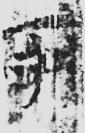取
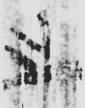之
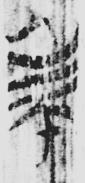民
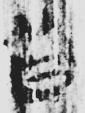皆
